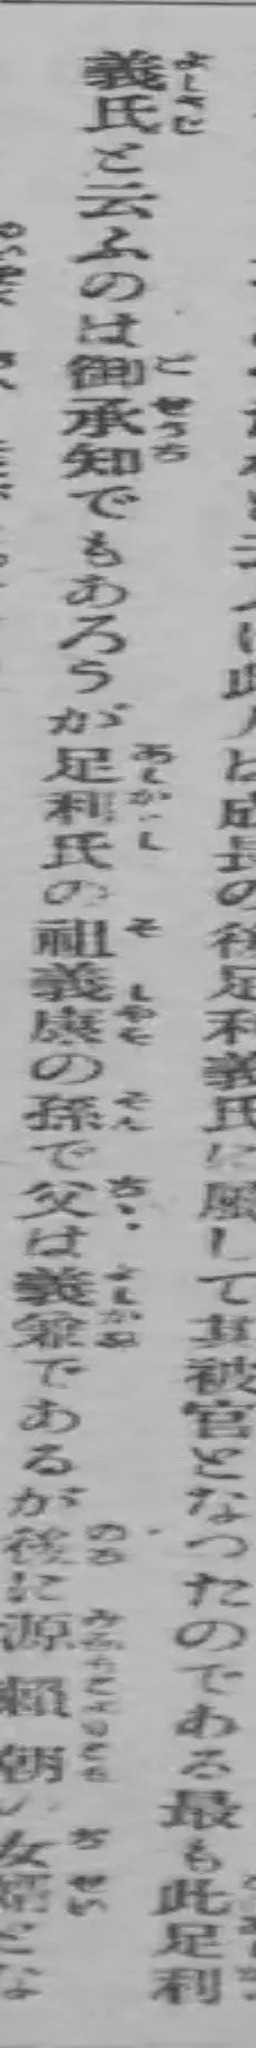義氏と云ふのは御承知でもあろうが足利氏の祖義康の孫で父は義兼であるが後に源頼朝の女婿とな
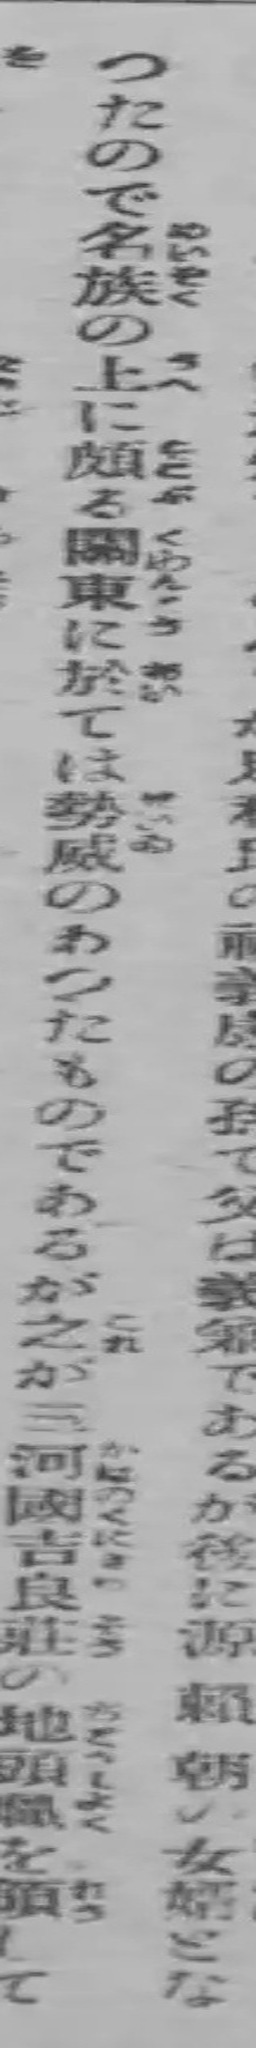吉良荘つたので名族の上に頗る関東に於ては勢威のあつたものであるが之が三河国吉良荘の地頭職を領して
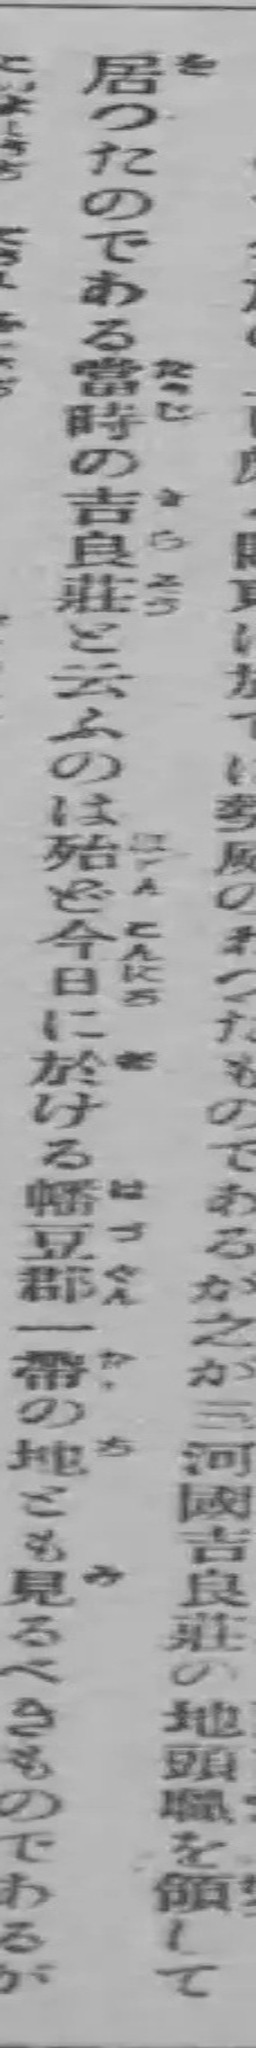居つたのである当時の吉良荘と云ふのは殆ど今日に於ける幡豆郡一帯の地とも見るべきものであるが
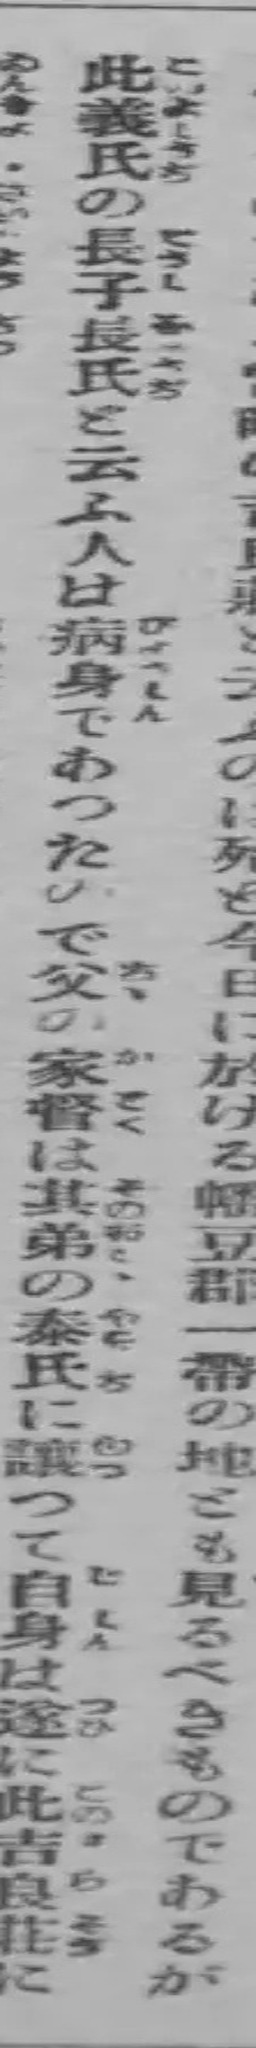吉良長氏此義氏の長子長氏と云ふ人は病身であつたので父の家督は其弟の泰氏に譲つて自身は遂に此吉良荘に
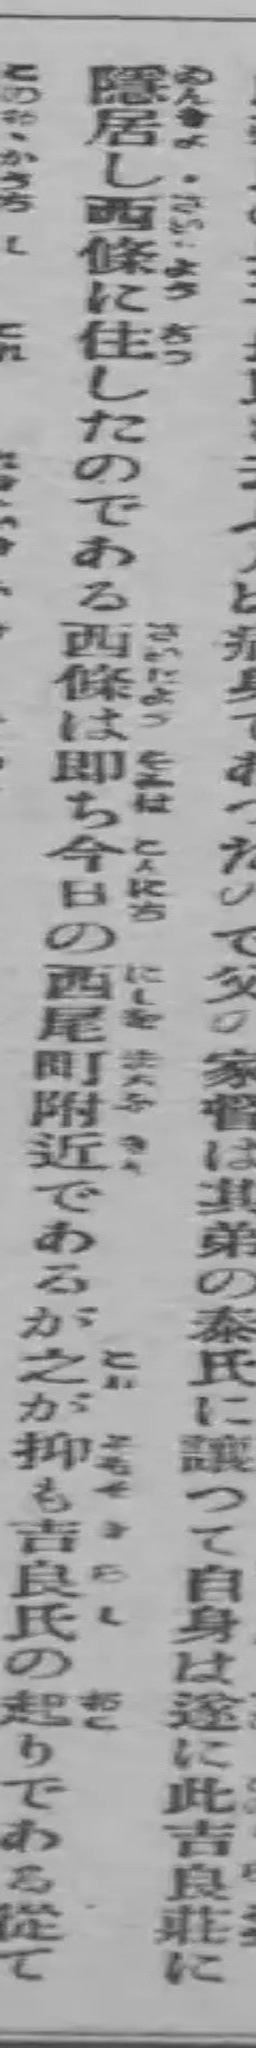隠居し西條に住したのである西條は即ち今日の西尾町附近であるが之が抑も吉良氏の起りである従て
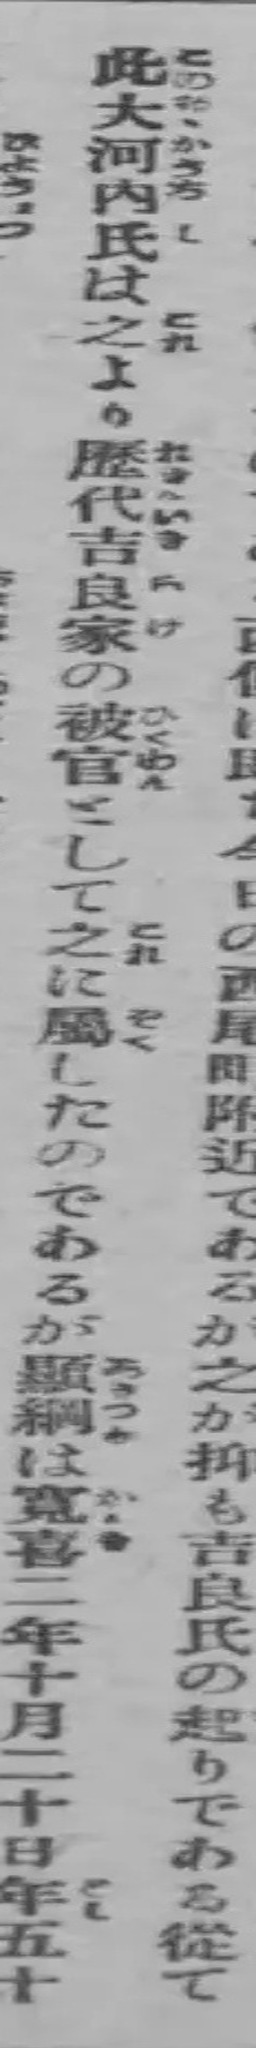此大河内氏は之より歴代吉良家の被官として之に属したのであるが顕綱は寛喜二年十月二十日年五十
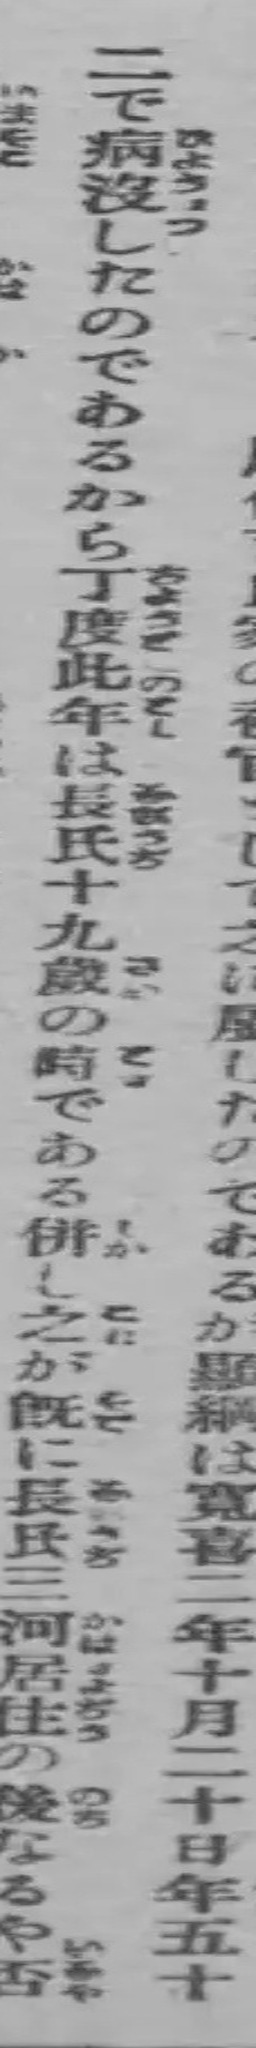二で病没したのであるから丁度此年は長氏十九歳の時である併し之が既に長氏三河居住の後なるや否
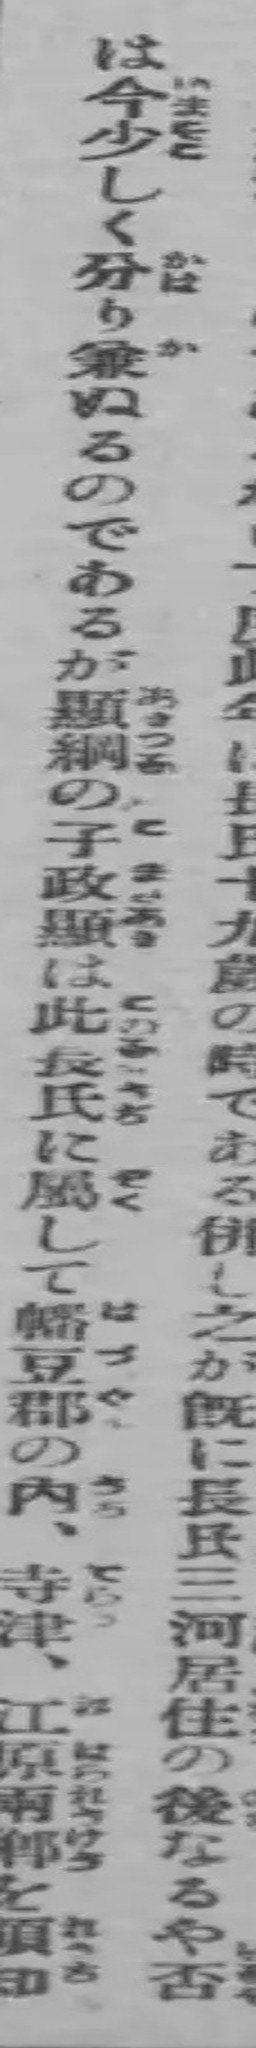大河内政顕は今少しく分り兼ぬるのであるが顕綱の子政顕は此長氏に属して幡豆郡の内、寺津、江原両郷を領地
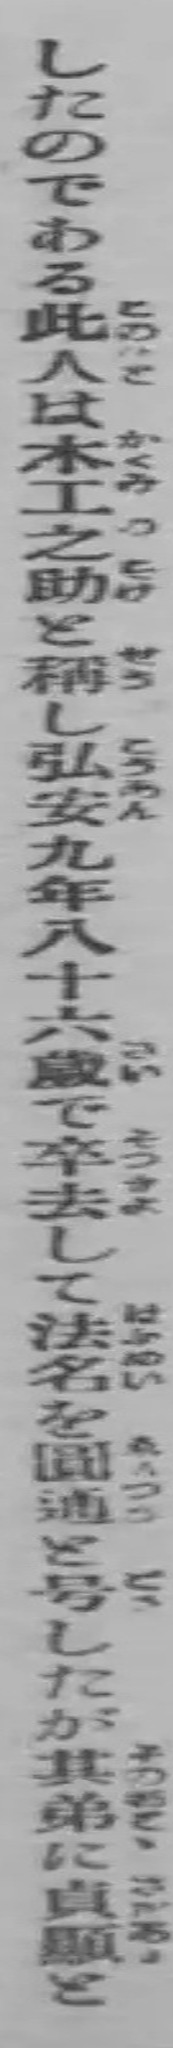したのである此人は木工之助と称し弘安九年八十六歳で卒去して法名を円通と号したが其弟に貞顕と
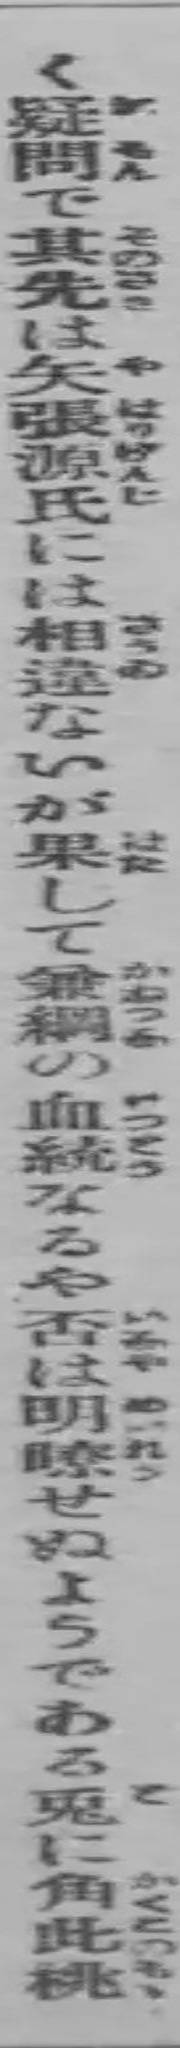く疑問で其先は矢張源氏には相違ないが果して兼綱の血統なるや否は明瞭せぬようである兎に角此桃
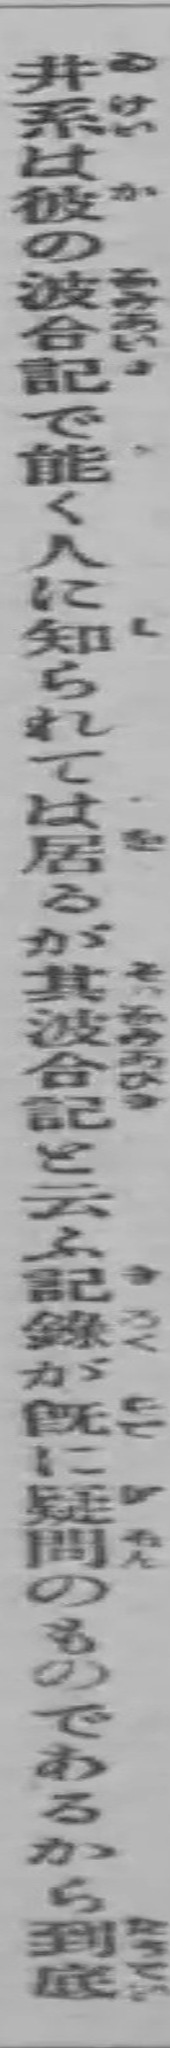井系は彼の波合記で能く人に知られては居るが其波合記と云ふ記録が既に疑問のものであるから到底
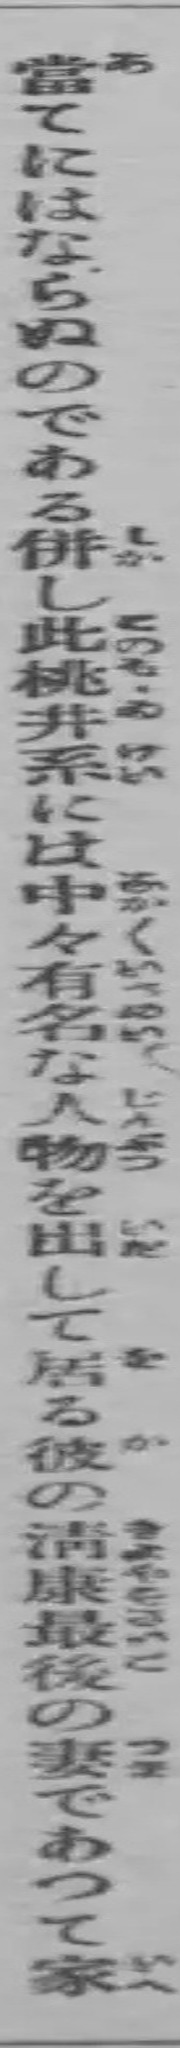当てにはならぬのでる併し此桃井系には中々有名な人物を出して居る彼の清康最後の妻であつて家
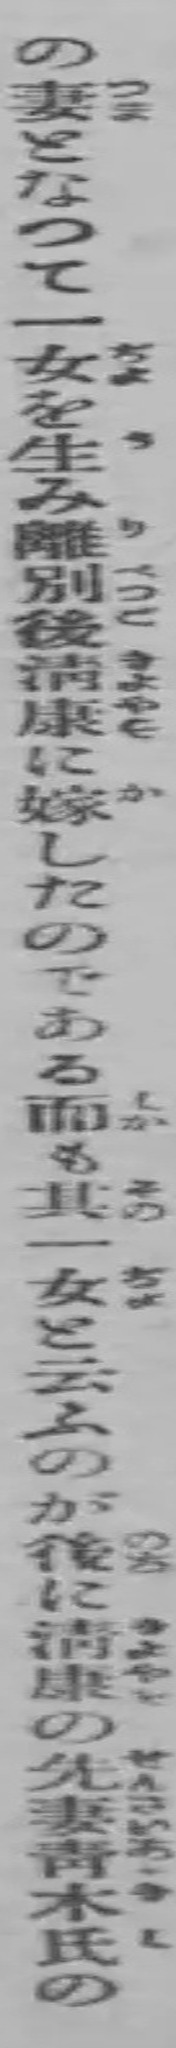の妻となつて一女を生み離別後清康に嫁したのである而も其一女と云ふのが後に清康の先妻青木氏の
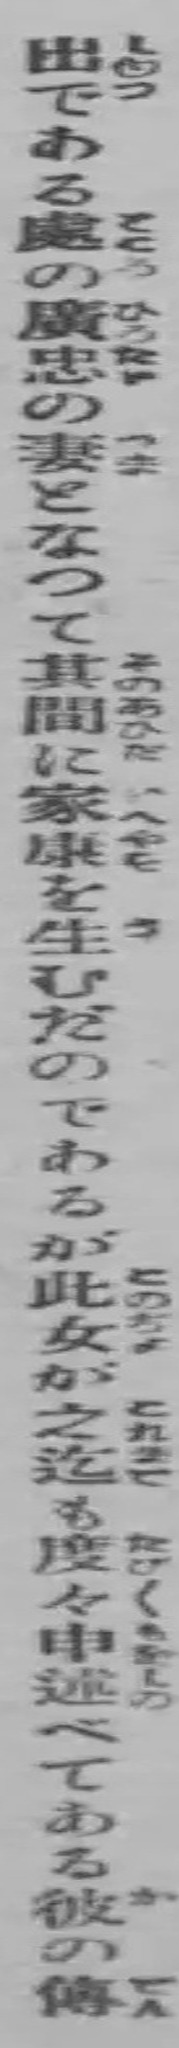出である処の広忠の妻となつて其間に家康を生むだのであるが此女が之迄も度々申述べてある彼の伝
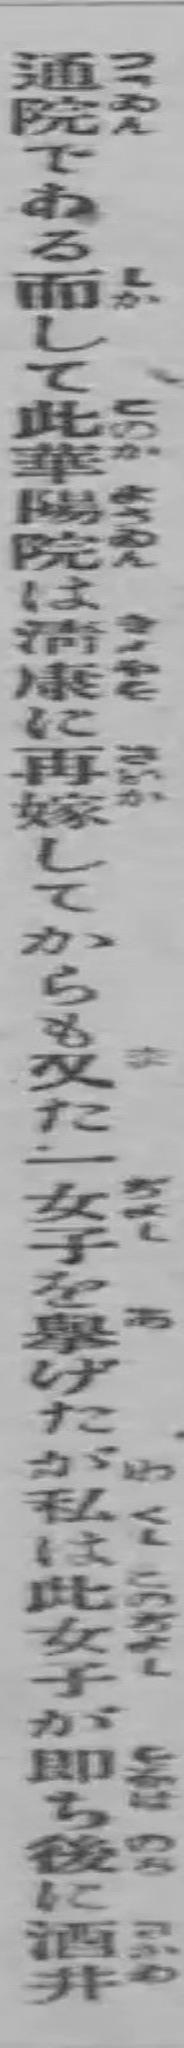通院である而して此華陽院は清康に再嫁してからも又た一女子を挙げたが私は此女子が即ち後に酒井
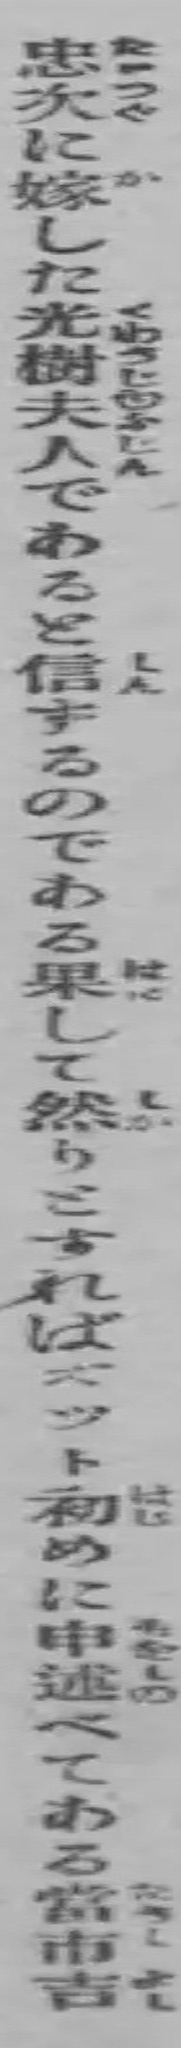忠次に嫁した光樹夫人であると信ずるのである果して然りとすればズツト初めに申述べてある当市吉
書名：豊橋市史談
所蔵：国立国会図書館 National Diet Library, JAPAN
